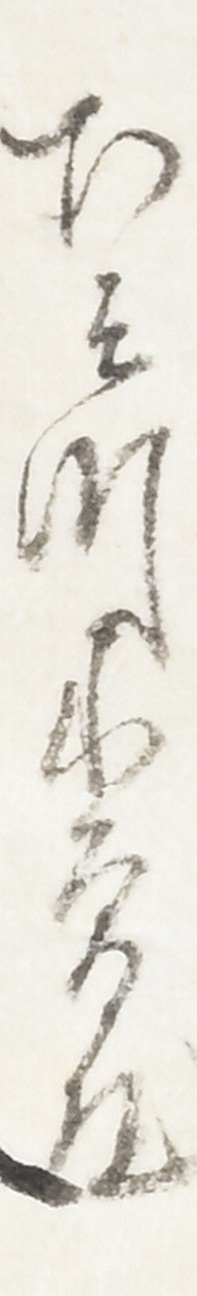下モ町木曽屋
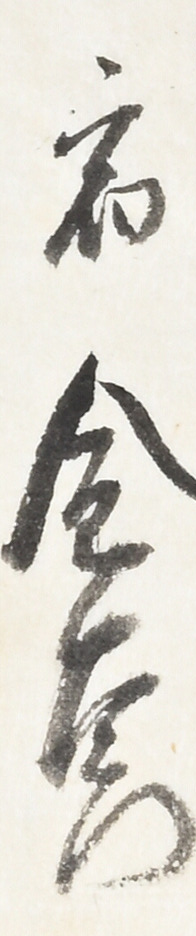宿金右衛門
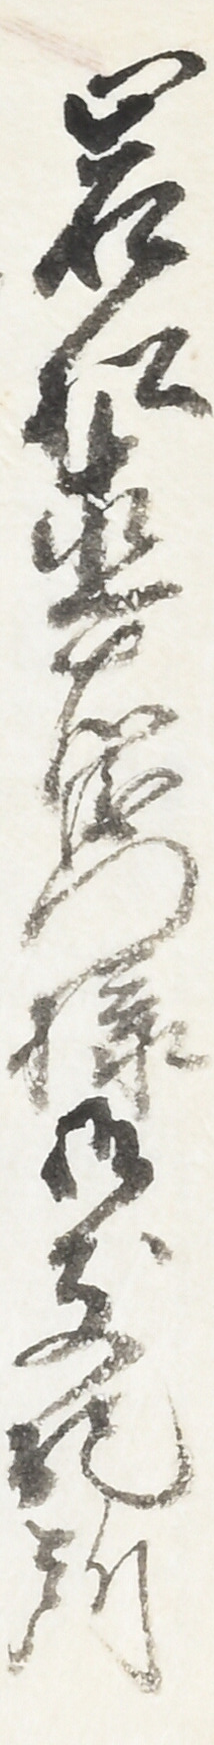岩松直右衛門様御支配所
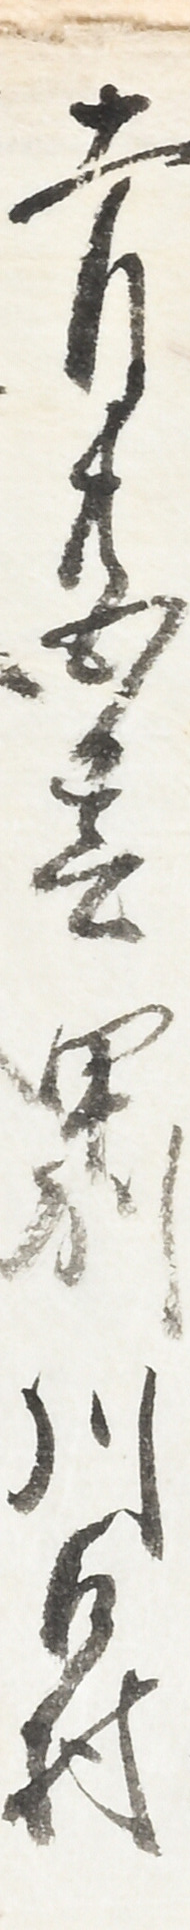十一月廿五日着甲州川口村
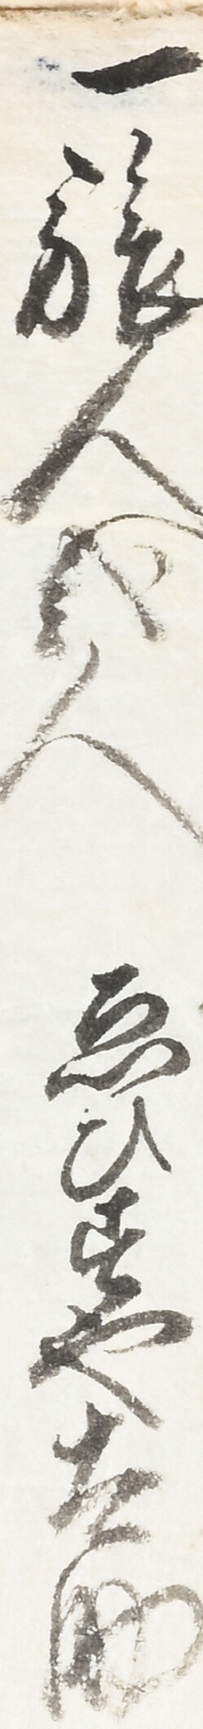一旅人弐人えひすや太助
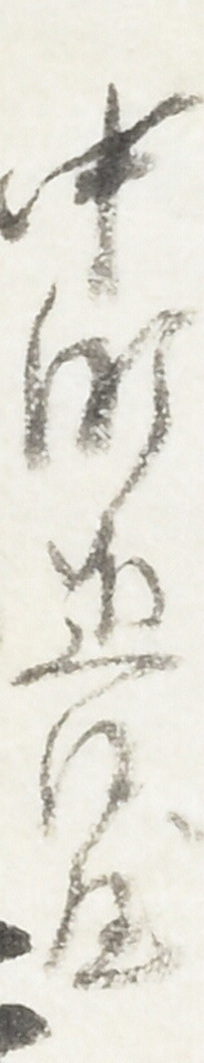中町近江屋

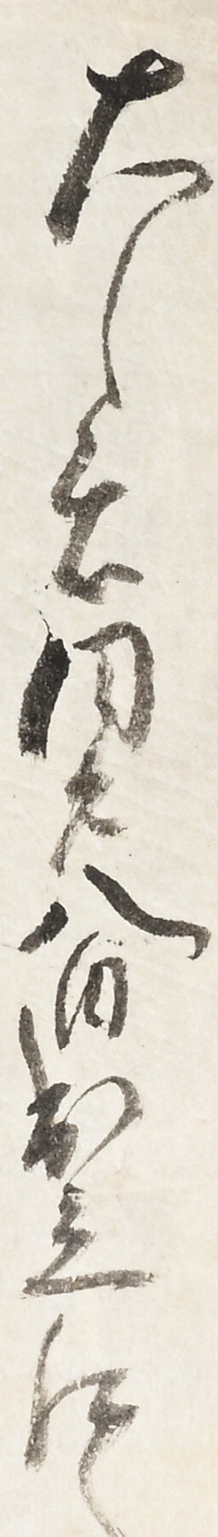右之者同廿八日出立仕候
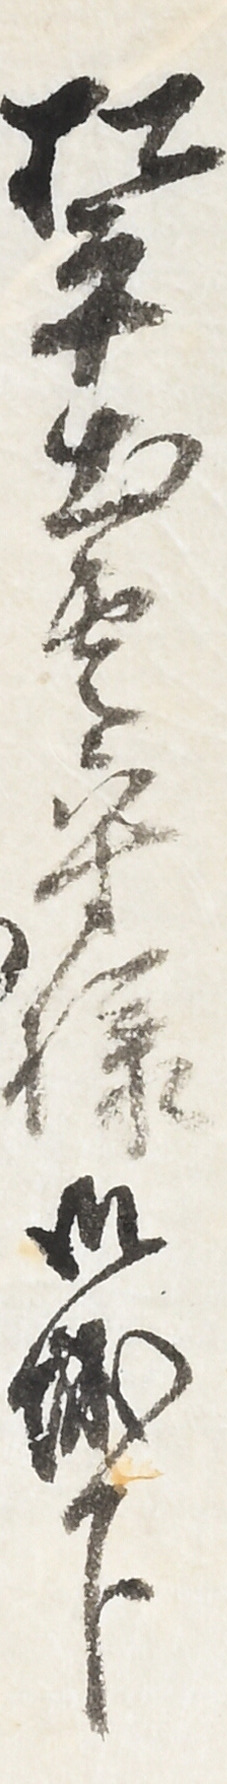松平出雲守様御城下
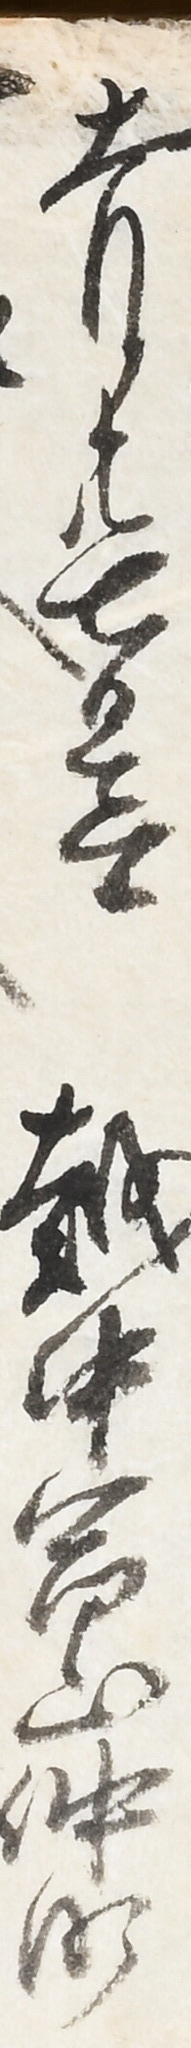十一月廿七日着越中冨山仲町
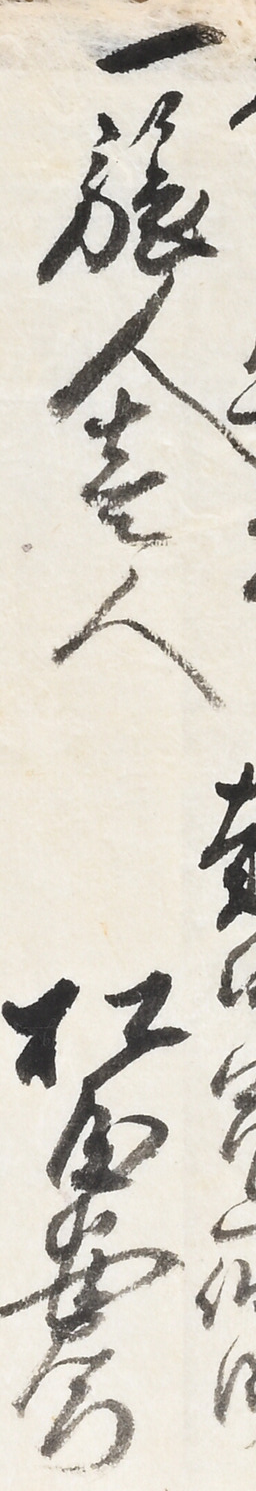一旅人壱人松屋安右衛門
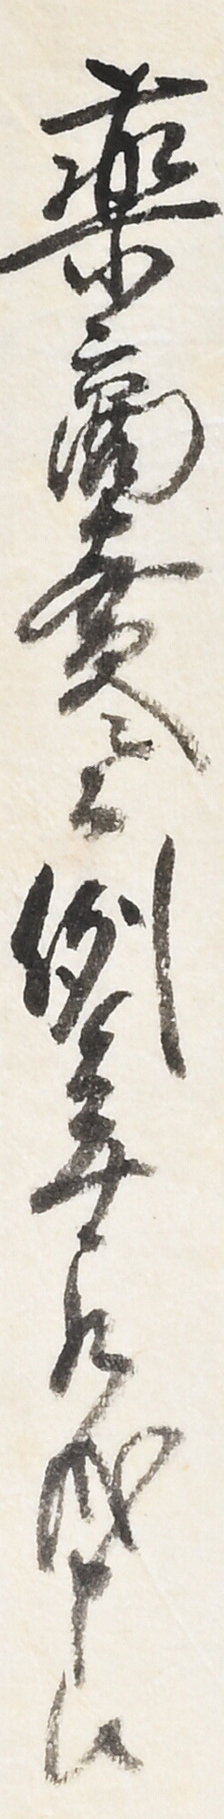薬商売ニ而例年罷越申候
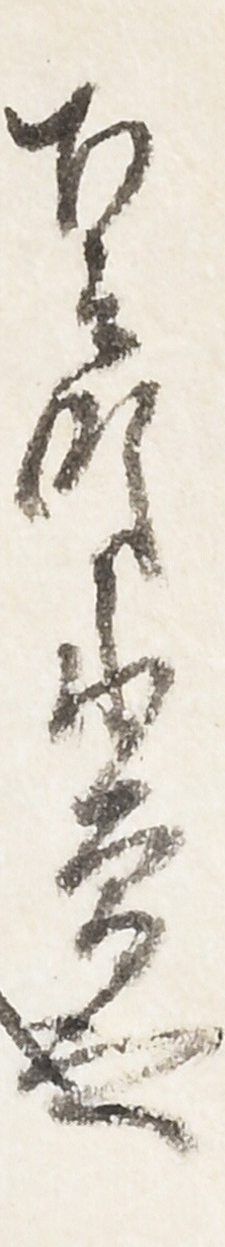下モ町木曽や
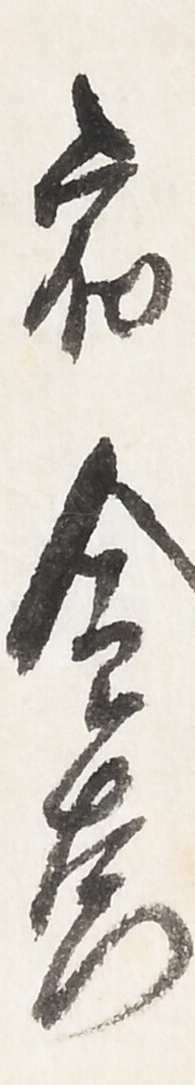宿金右衛門
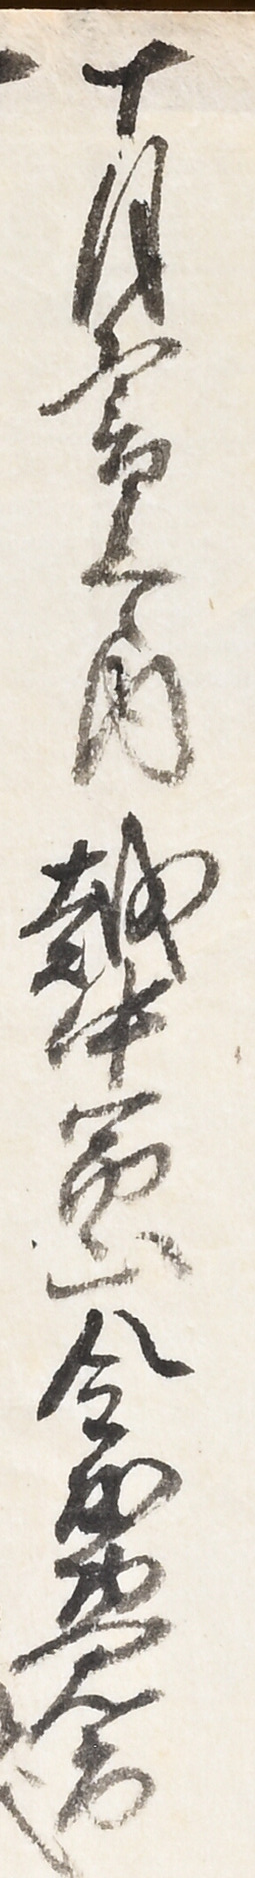十月書上之内越中冨山金屋惣右衛門
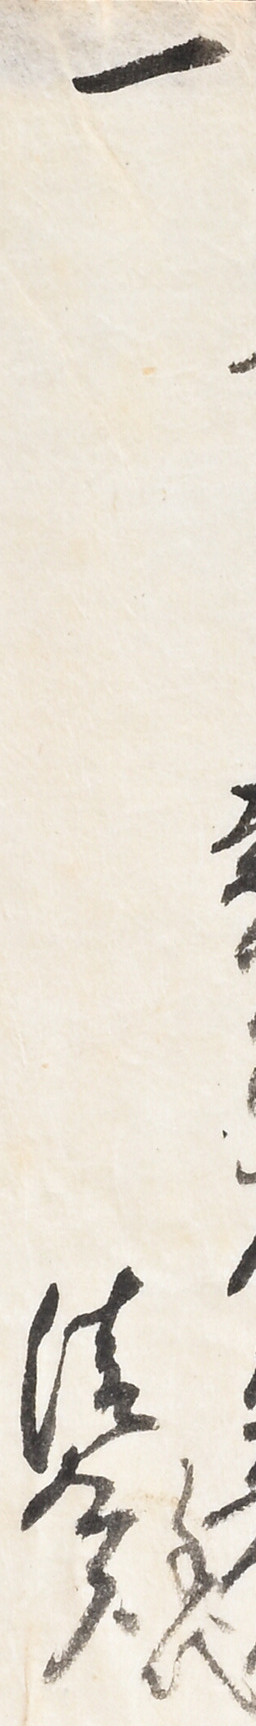一清九郎
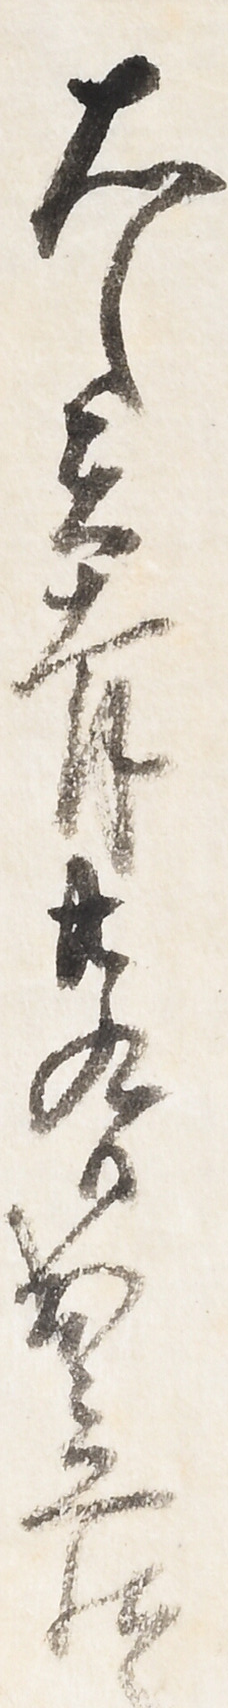右之者十一月廿九日出立仕候
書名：旅人泊控帳
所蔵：伊那市立高遠町図書館・合同会社AMANE
